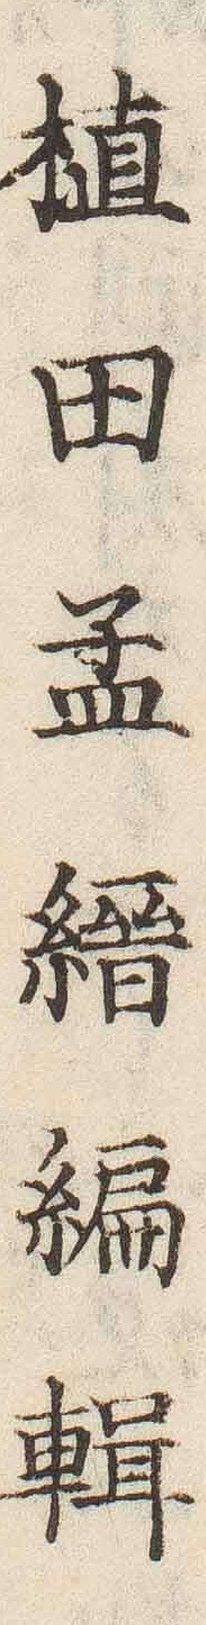植田孟縉編輯
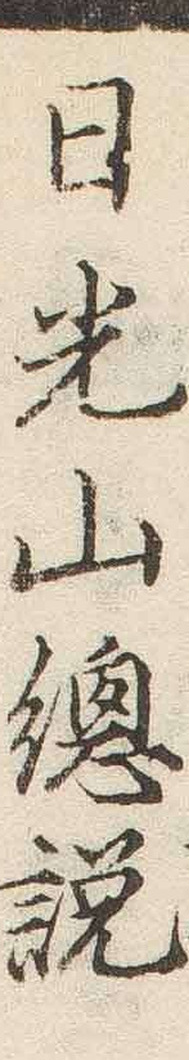日光山總説
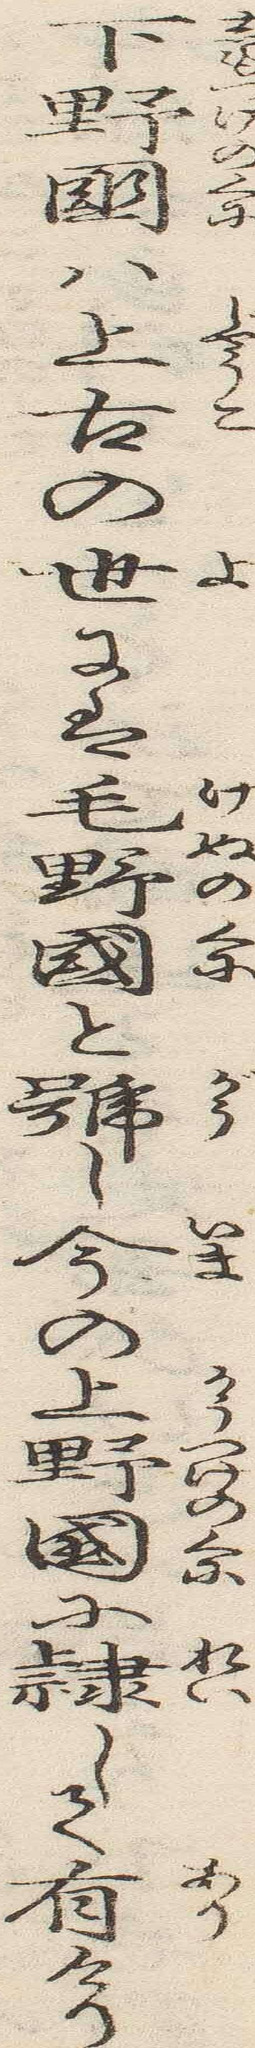下野國は上古の世には毛野國と號し今の上野國に隷して有けり
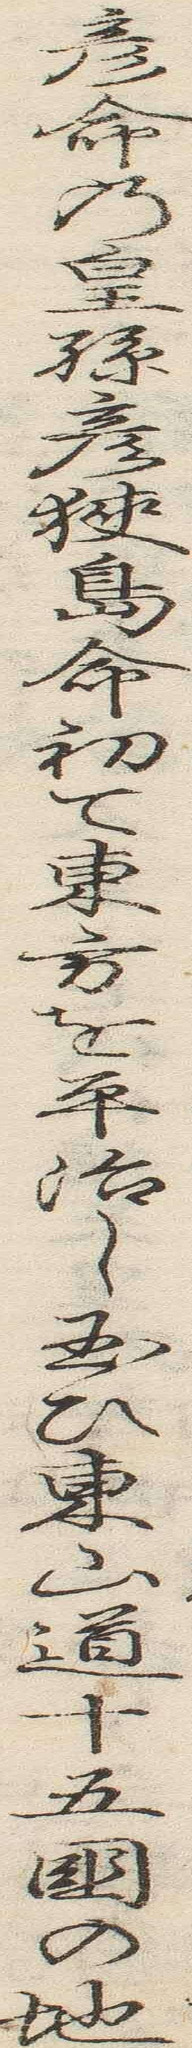彦命の皇孫彦狹島命初て東方を平治し玉ひ東山道十五國の地
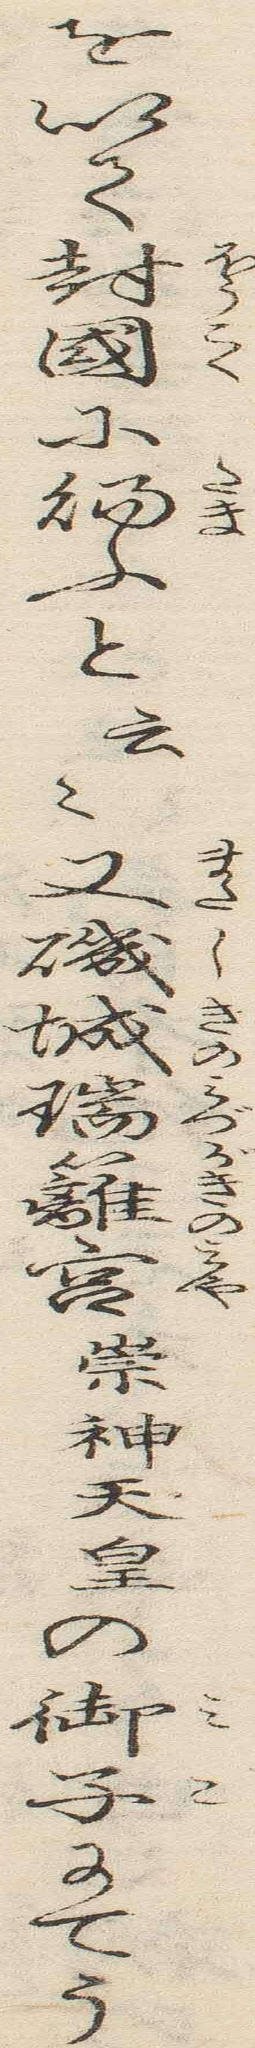を以て封國に賜ふと云〻又磯城瑞籬宮崇神天皇の御子にてう
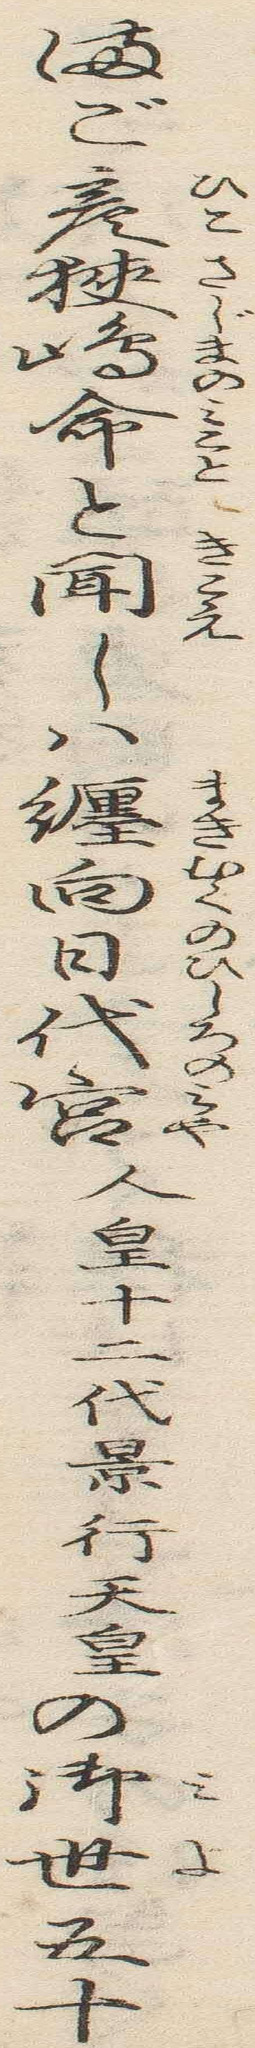まご彦狹嶋命と聞しは纒向日代宮人皇十二代景行天皇の御世五十
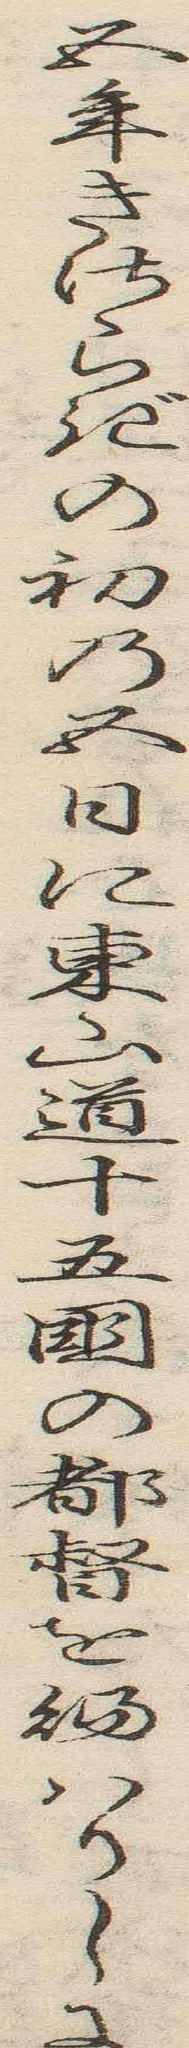五年きさらぎの初の五日に東山道十五國の都督を賜はりしに
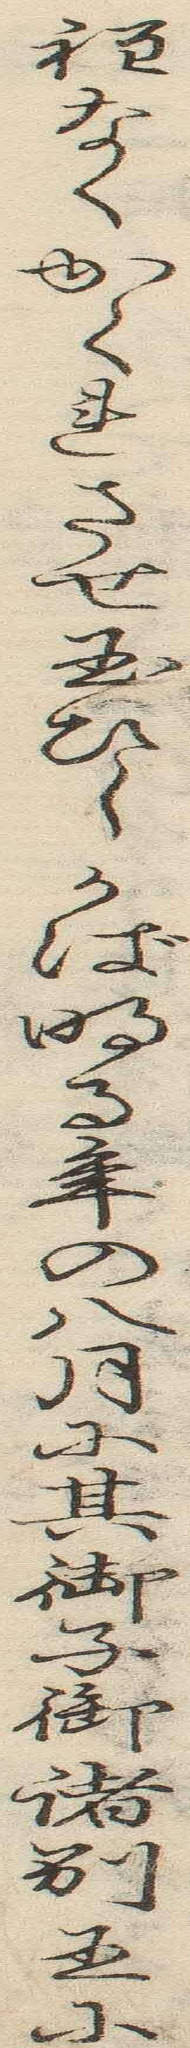程なくかくれさせ玉ひしかば明る年の八月に其御子御諸別王に
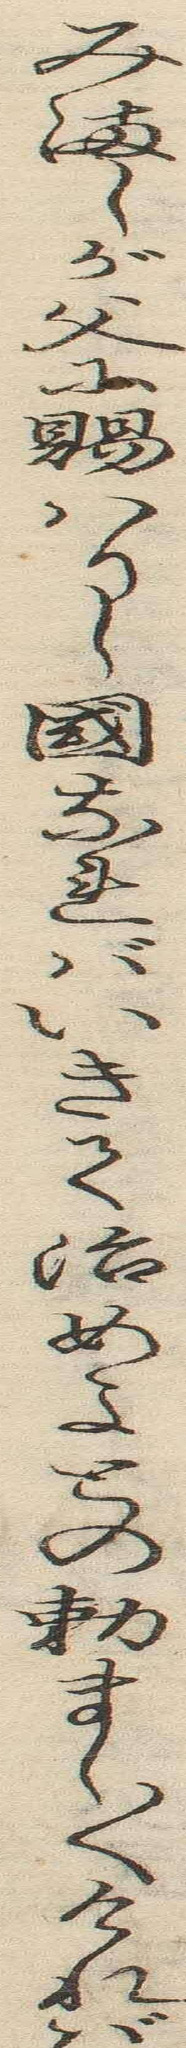みましが父に賜はりし國なればいきて治めよとの勅まし〳〵ければ

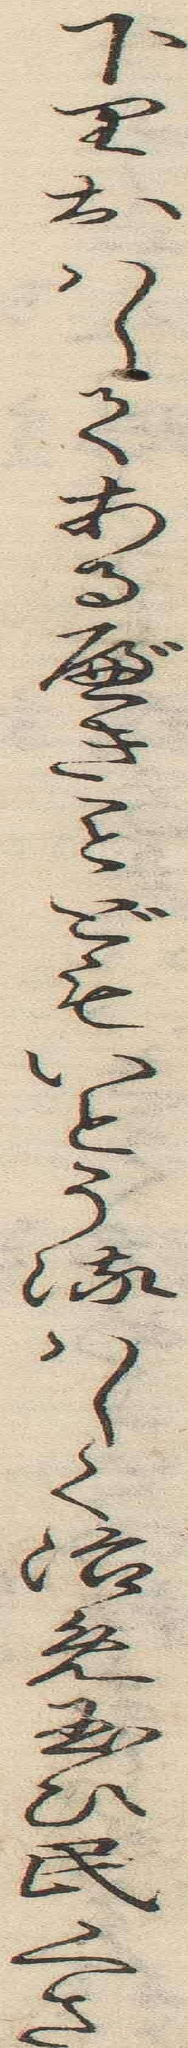下りおはしてあるべきことどもいとうるはしく治め玉ひ民くさ
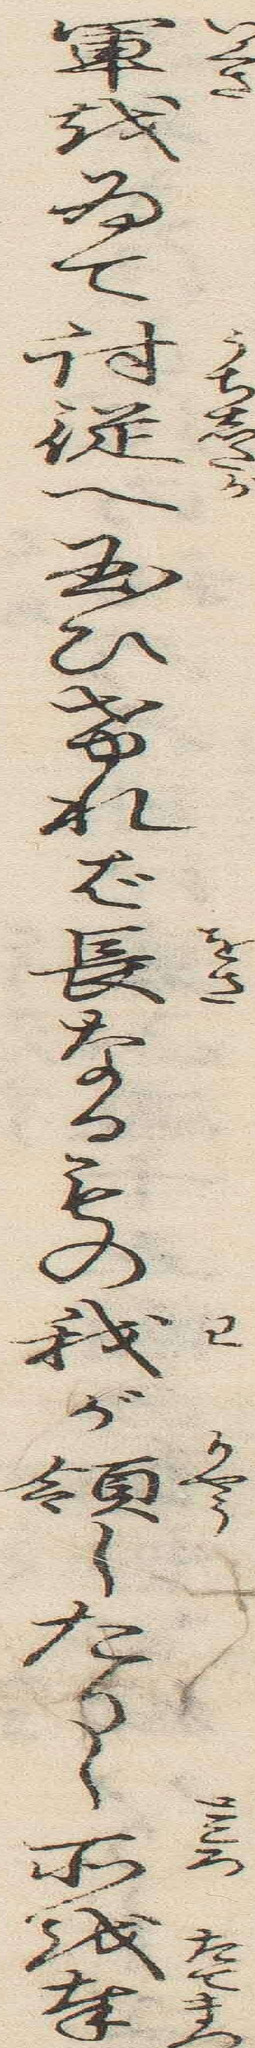軍を為て討従へ玉ひければ長なるもの我が領したりし所を奉
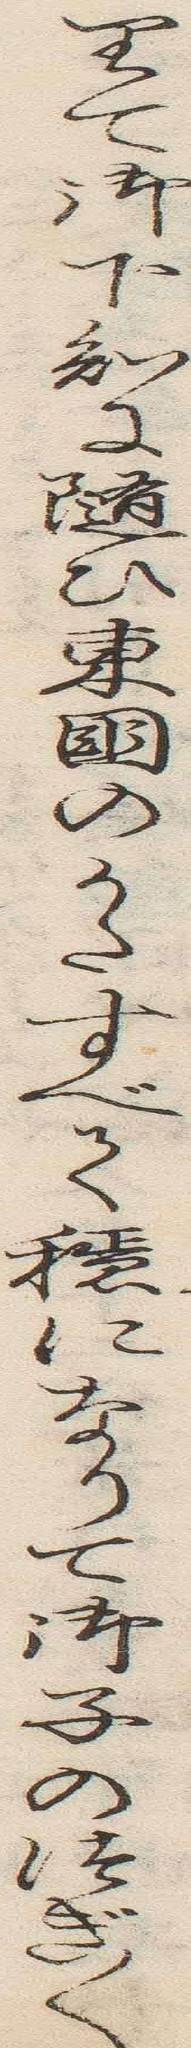りて御下知に随ひ東國のかたすべて穩になりて御子のつぎ〳〵
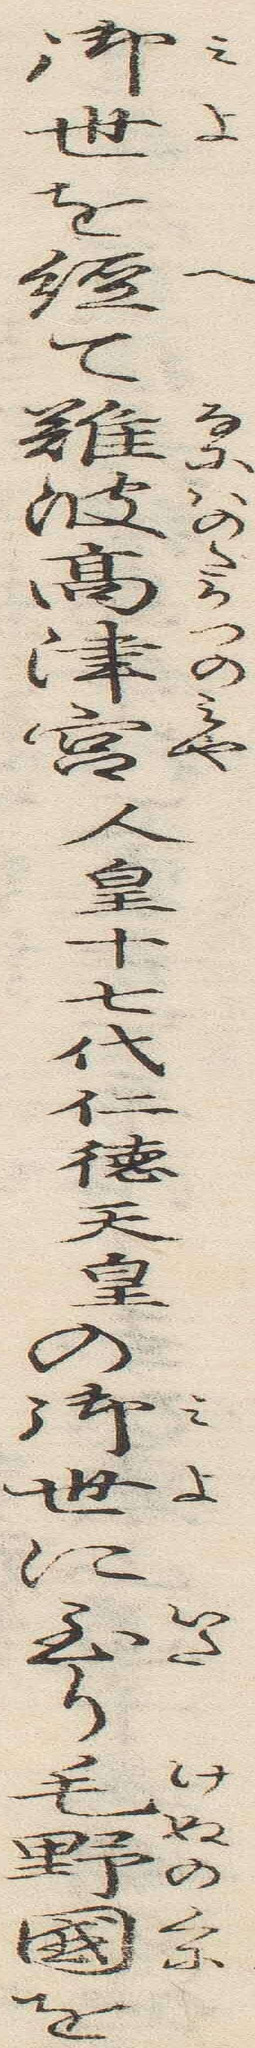御世を經て難波高津宮人皇十七代仁德天皇の御世に至り毛野國を
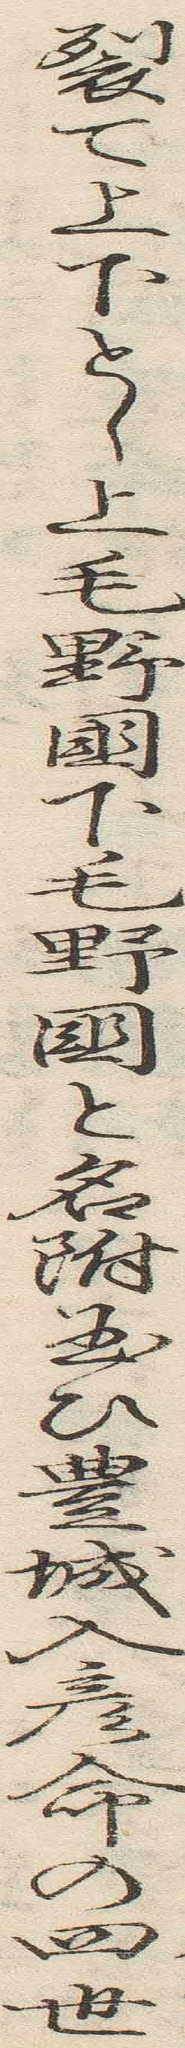裂て上下とし上毛野國下毛野國と名附玉ひ豊城入彦命の四世
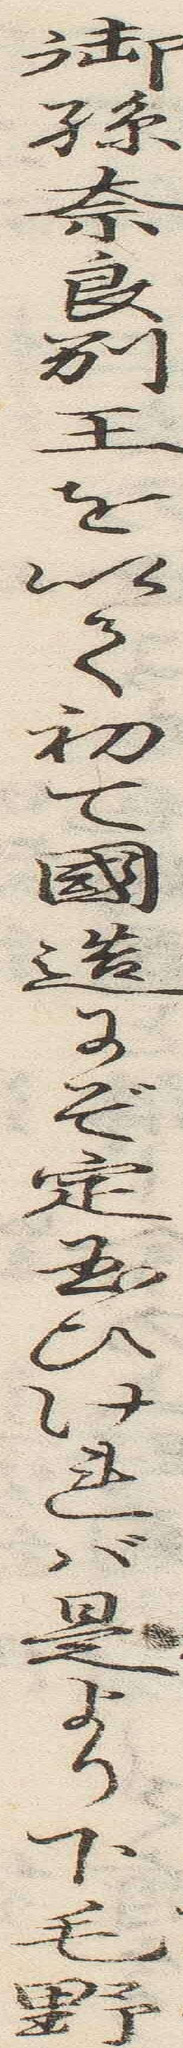御孫奈良別王を以て初て國造にぞ定玉ひければ是より下毛野
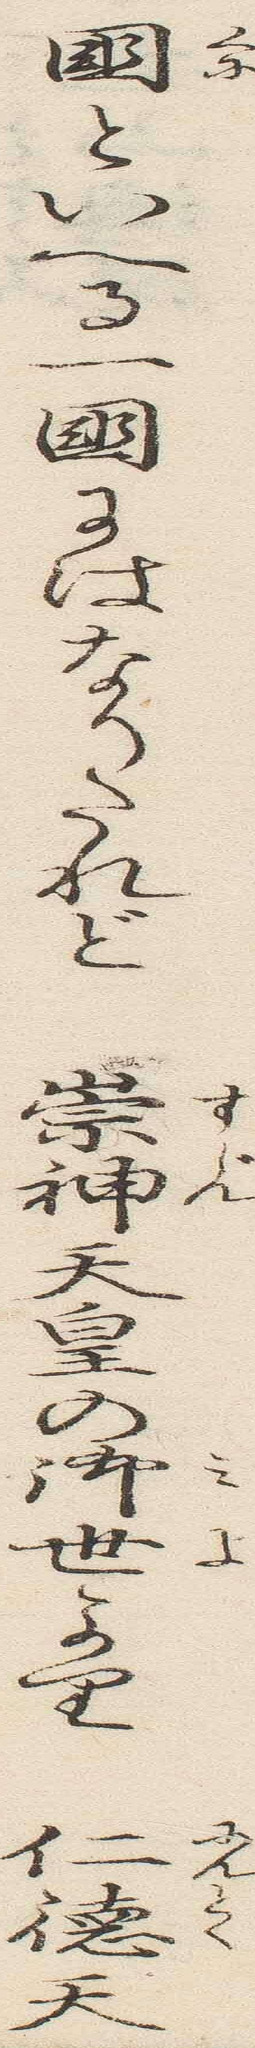國といへる一國にはなりたれど崇神天皇の御世より仁德天
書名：日光山志
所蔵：東京学芸大学附属図書館 国文学研究資料館
